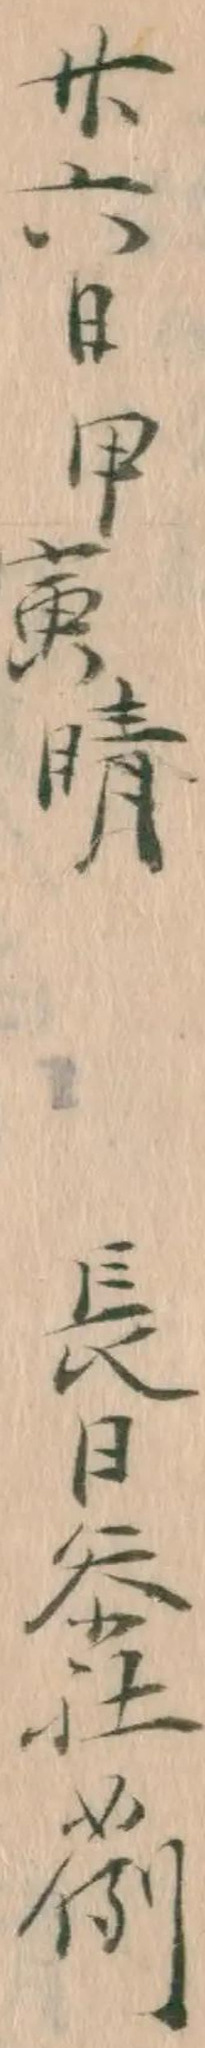廿六日甲寅晴長日参社如例
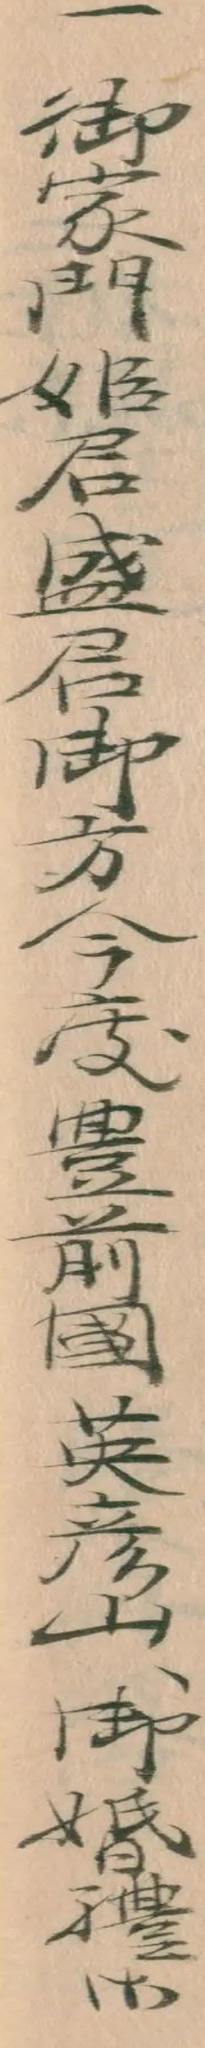一御家門姫君盛君御方今度豊前国英彦山へ御婚禮御
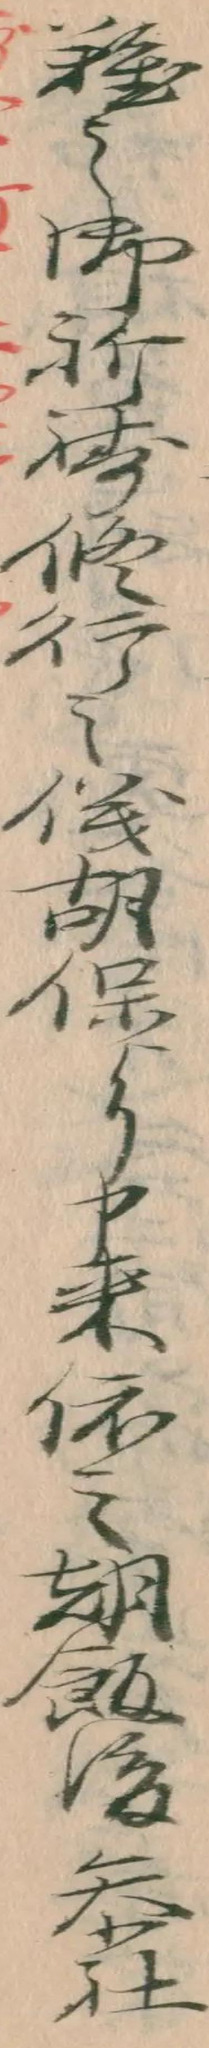難之御祈祷修行之儀胡保より申来依之朝飯後参社
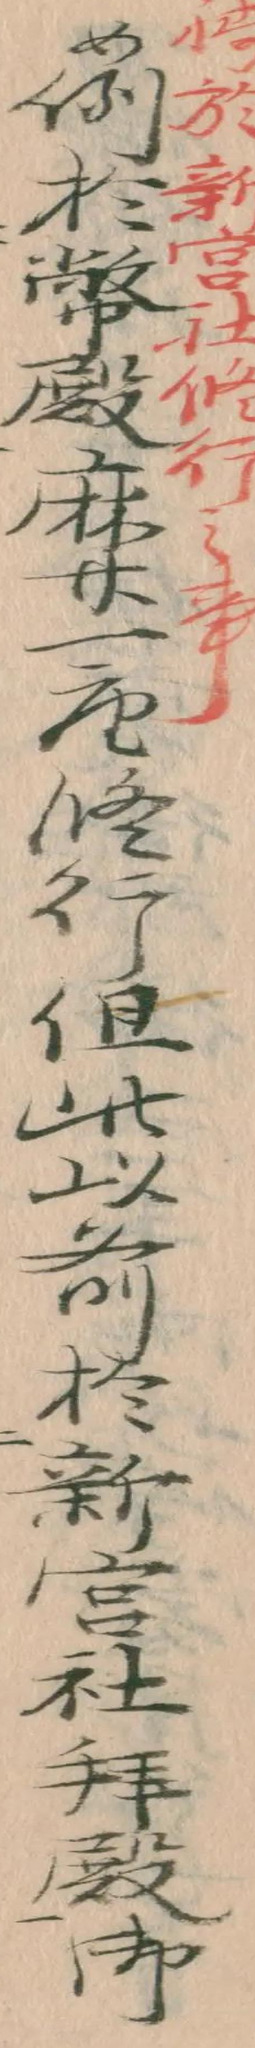如例於幣殿麻廿一座修行但此以前於新宮社拝殿御
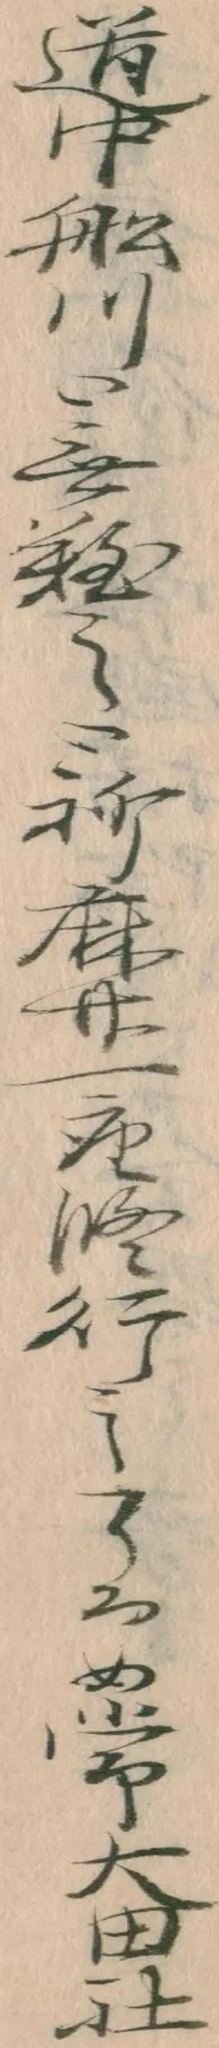道中舩川御無難之御祈麻廿一座修行之了而常大田社
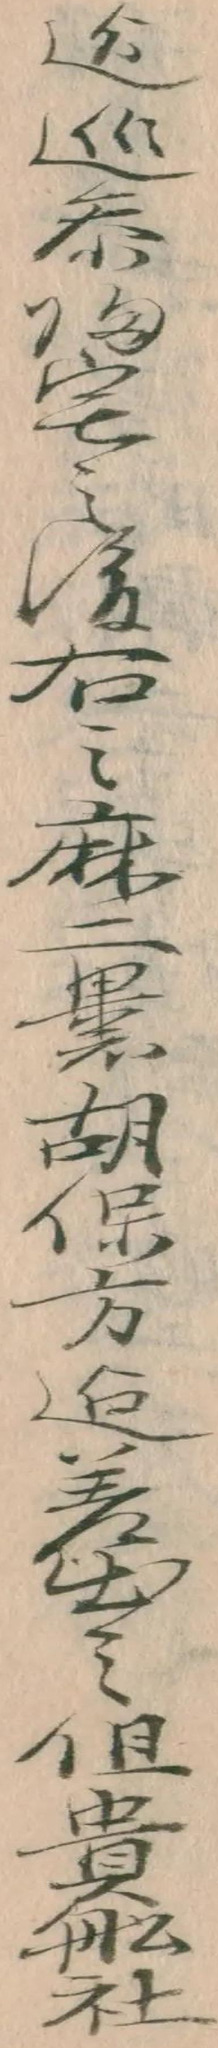近巡参帰宅之後右之麻二褁胡保方迄差出之但貴舩社
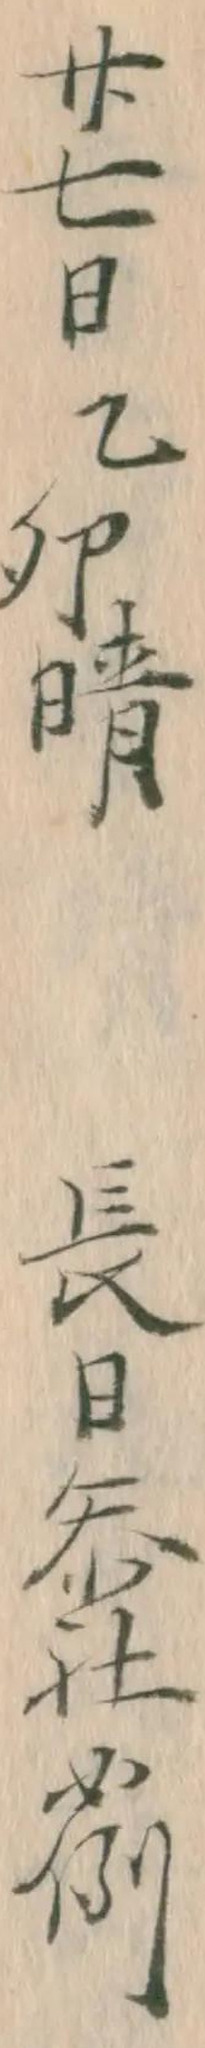廿七日乙卯晴長日参社如例
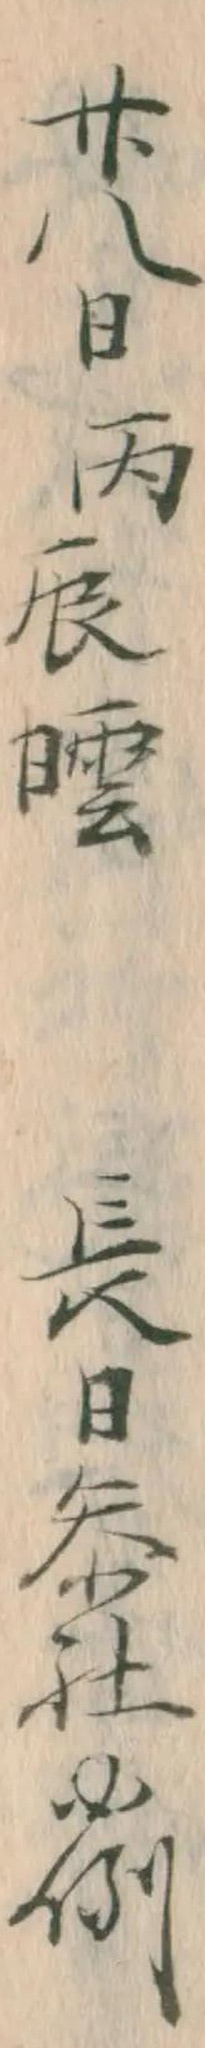廿八日丙辰曇長日参社如例
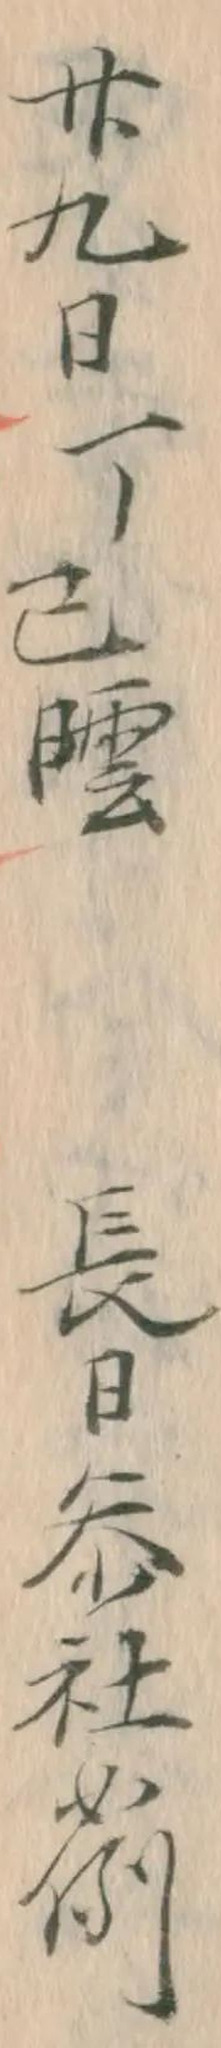廿九日丁巳曇長日参社如例
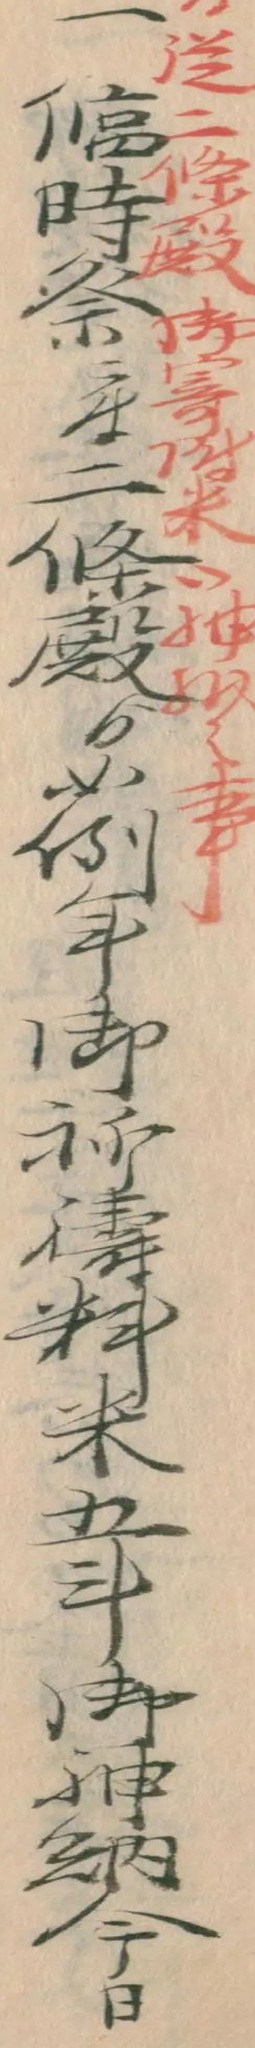一臨時祭ニ付二條殿ゟ如例年御祈祷料米五斗御神納今日

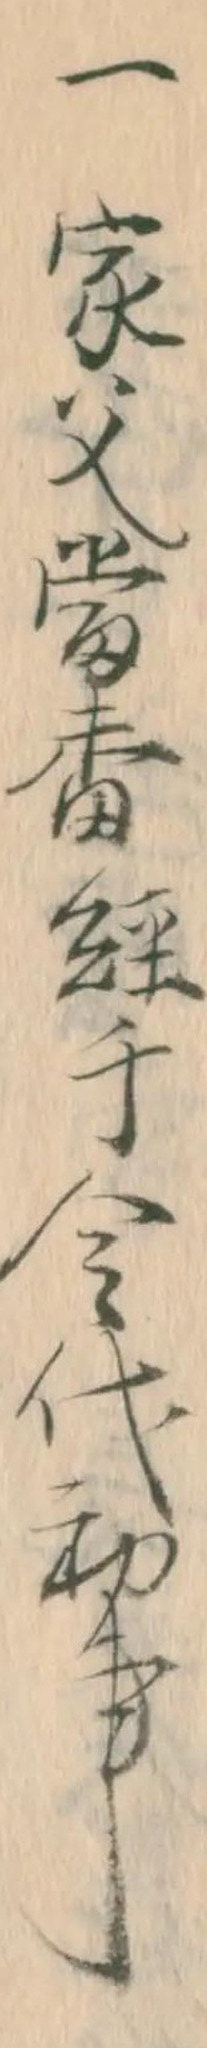一家父當番経千令代初事
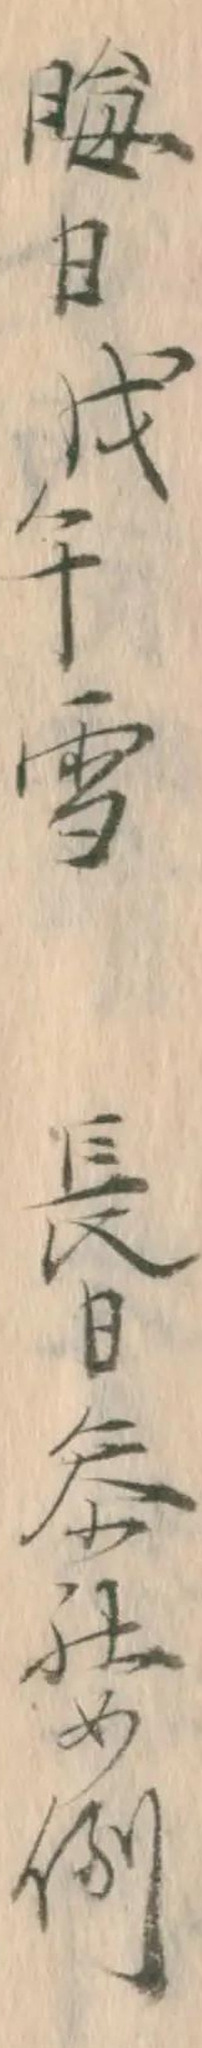晦日戊午雪長日参社如例
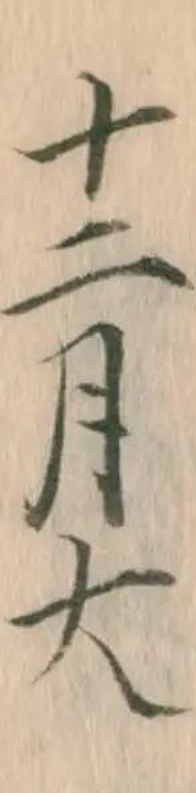十二月大
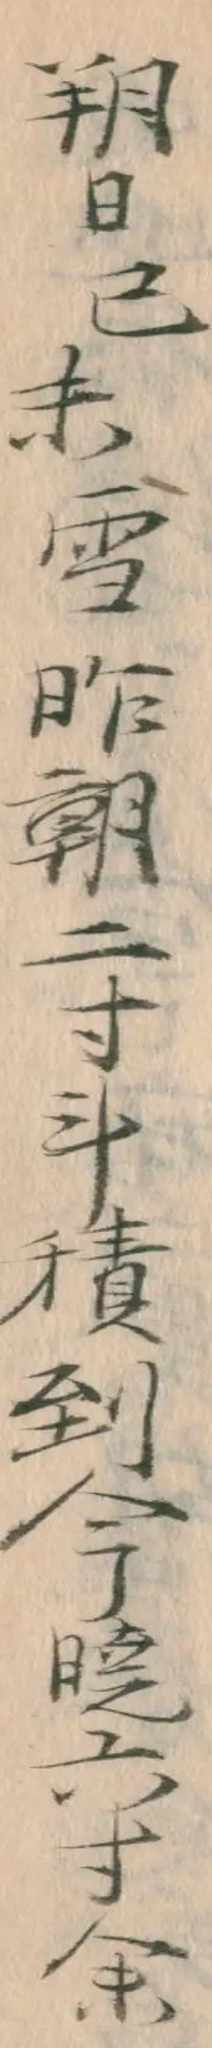朔日己未雪昨朝二寸計積到今暁六寸余
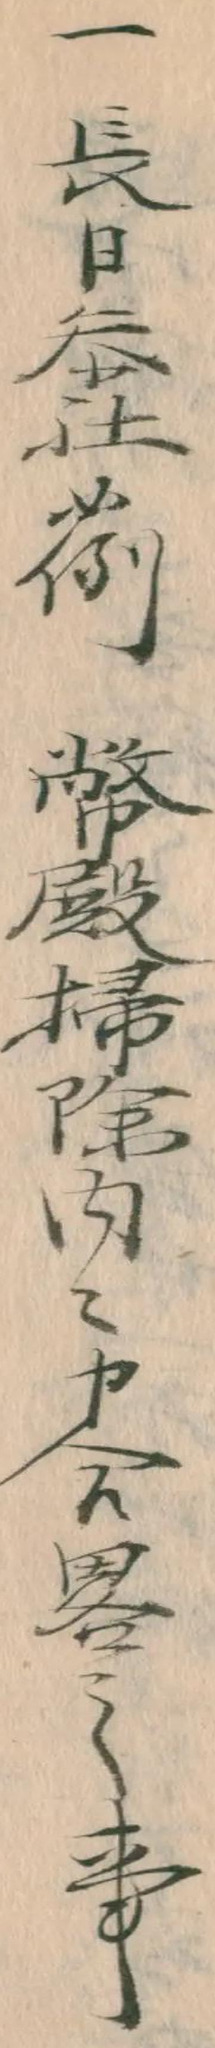一長日参社如例幣殿掃除内々申合畧之事
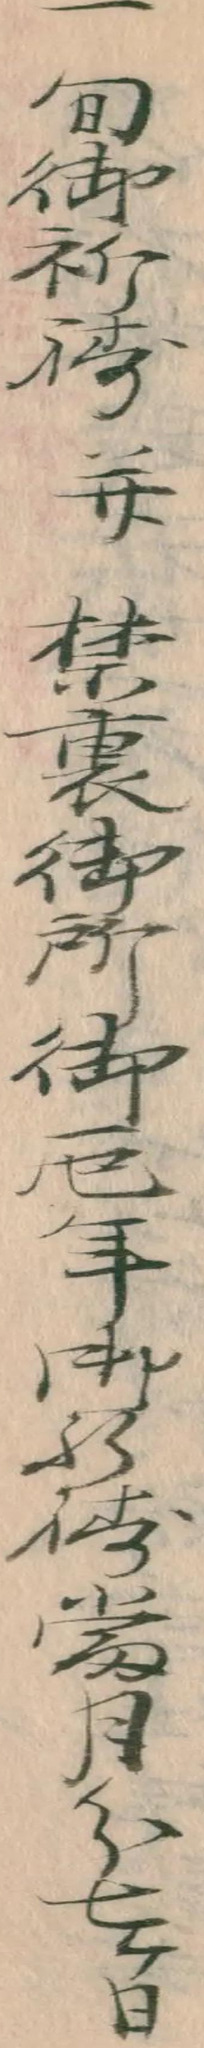一旬御祈祷并禁裏御所御厄年御祈禱當月分七ケ日
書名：賀茂社記録. 第74冊
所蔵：国立国会図書館 National Diet Library, JAPAN
